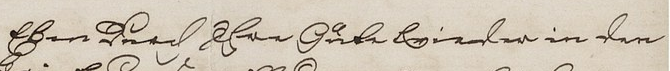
Eben durch Ihre Güte wieder in den
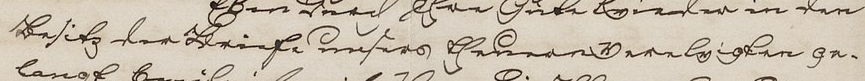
Besitz der Briefe unsers theuren Verewigten ge-
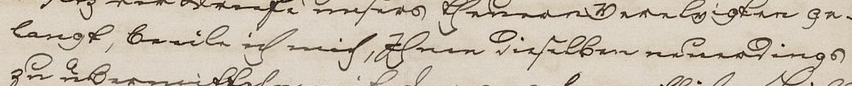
langt, beeile ich mich, Ihnen dieselben neuerdings
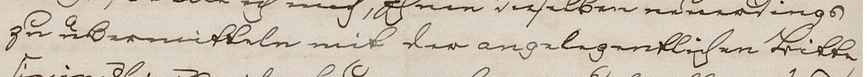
zu übermitteln mit der angelegentlichen Bitte,
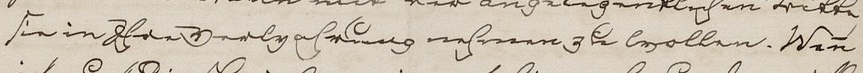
sie in Ihre Verwahrung nehmen zu wollen. Wenn
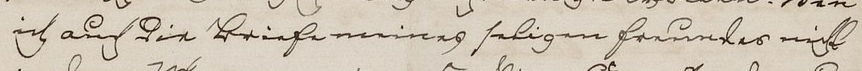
ich auch die Briefe meines seligen Freundes nicht
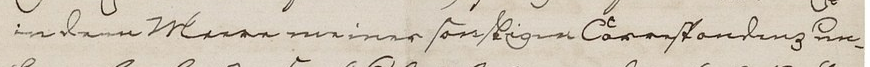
in dem Meere meiner sonstigen Correspondenz un-
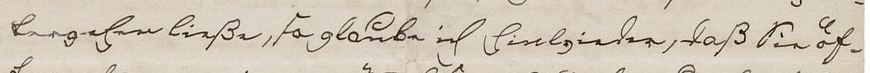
tergehen ließe, so glaube ich hinwieder, daß Sie öf-
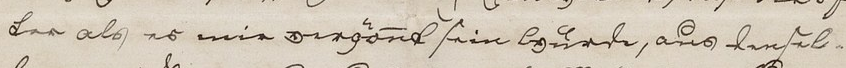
ter als es mir vergönnt sein würde, aus densel-
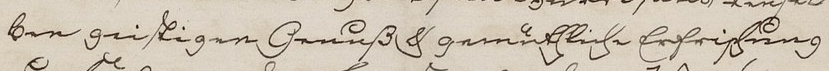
ben geistigen Genuß & gemüthliche Erfrischung
